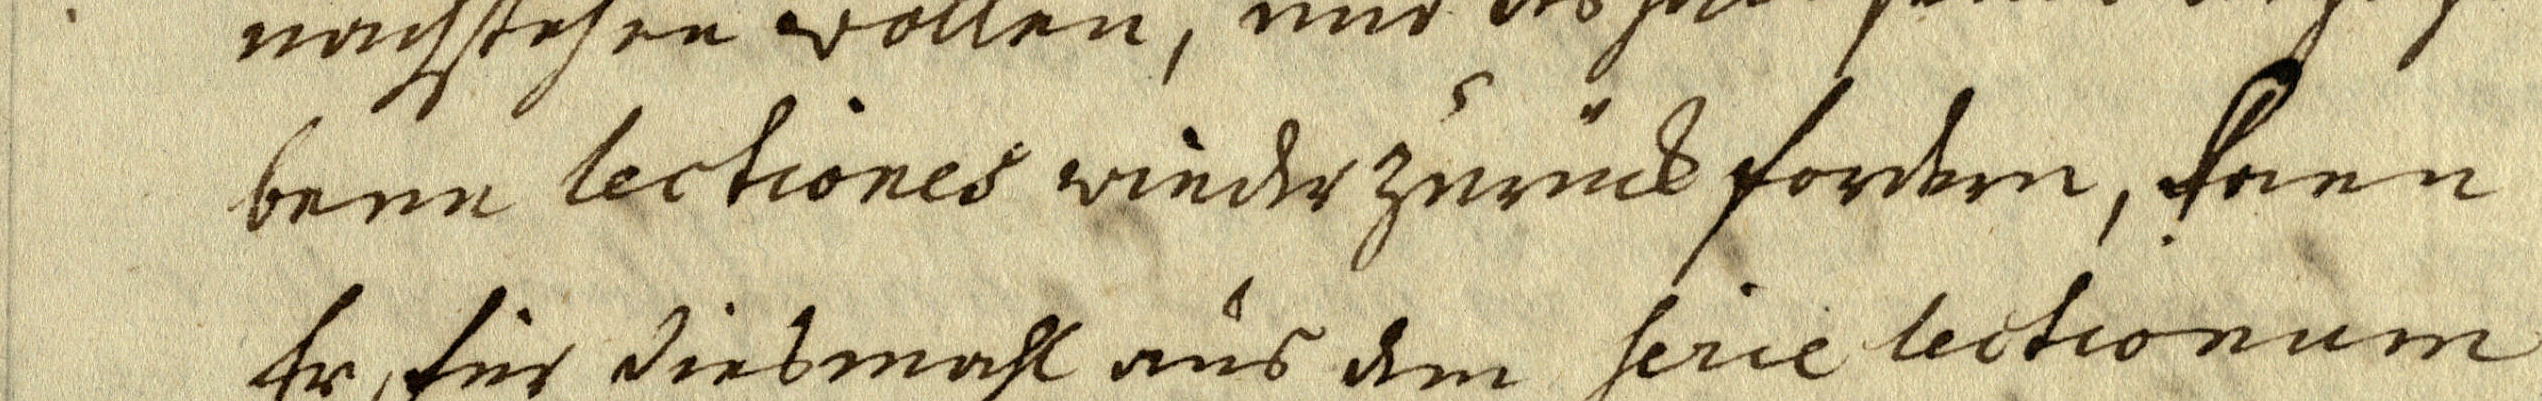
bene lectiones wieder zurück fordern, kann
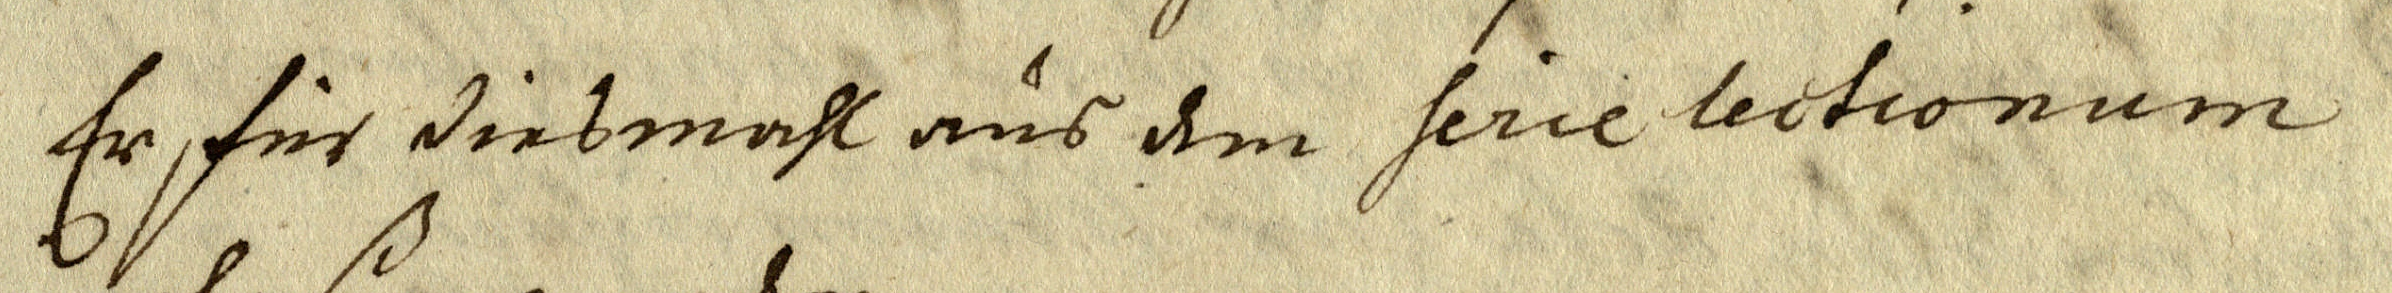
Er für diesmahl aus dem serie lectionum
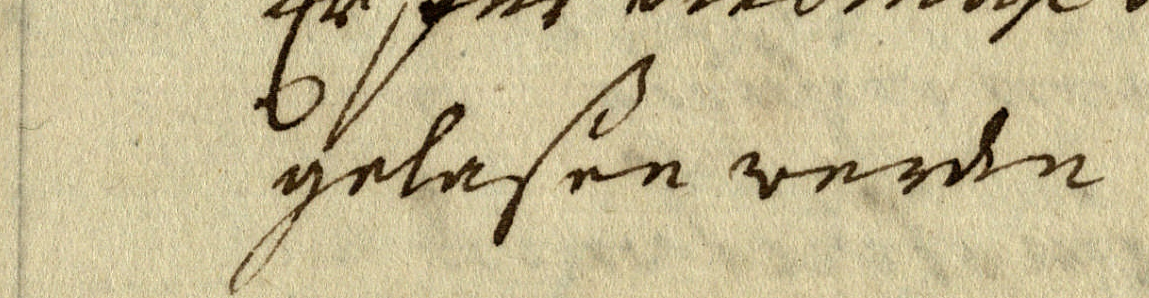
gelaßen werden
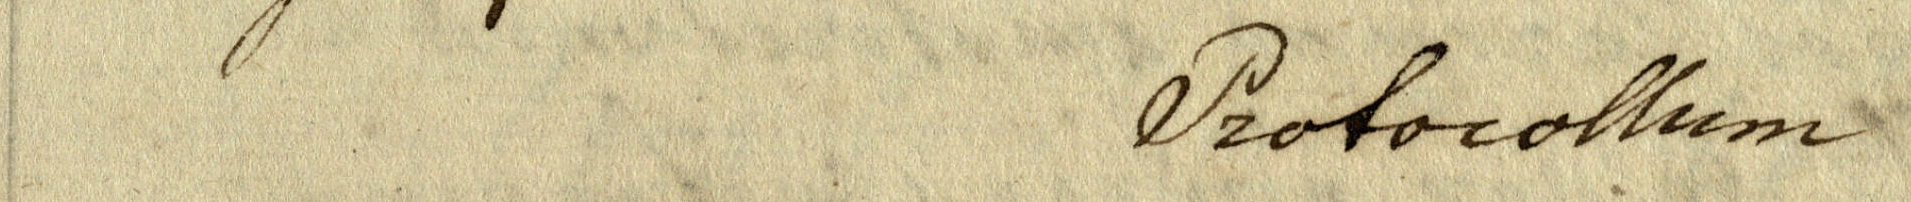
Protocollum
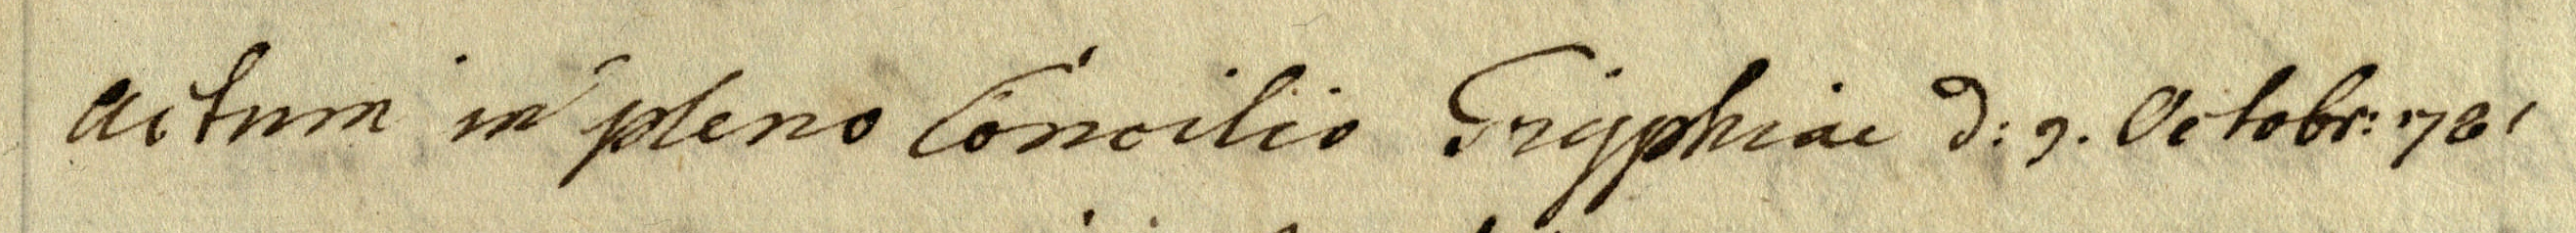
Actum in pleno Concilio Grÿphiae d: 9. Octobr: 1781
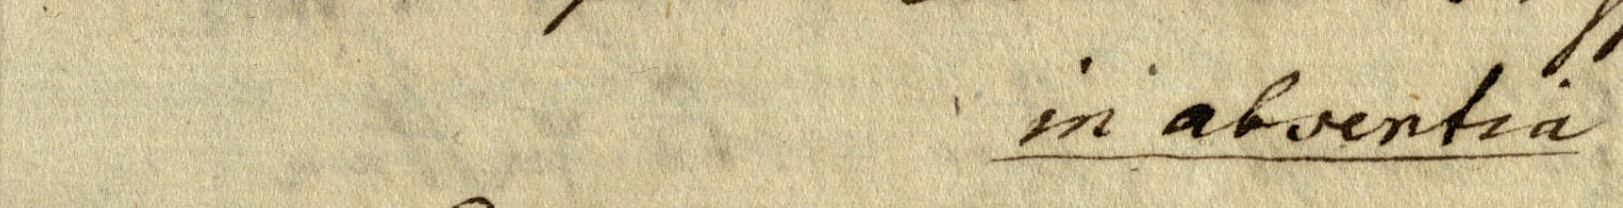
in absentia
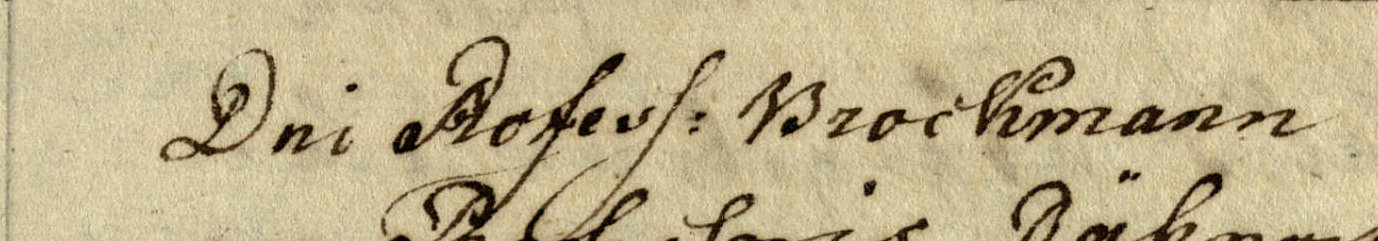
dei Profess: Brockmann
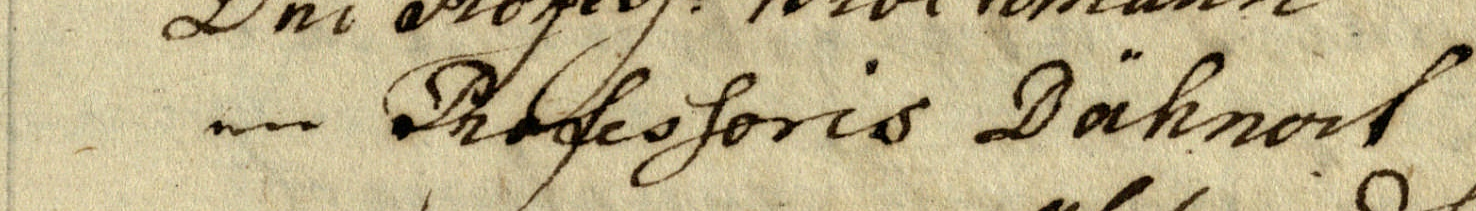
Professoris Dähnert
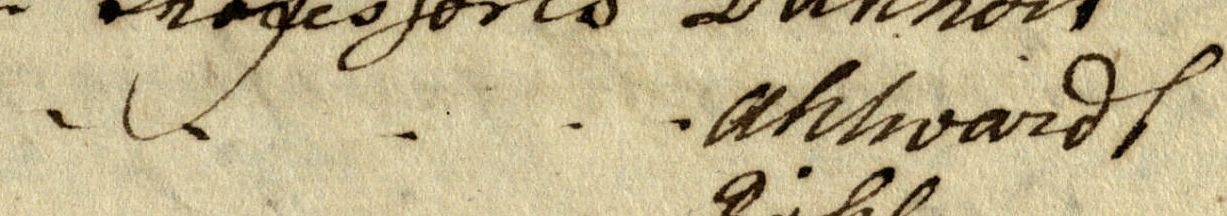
Ahlwardt
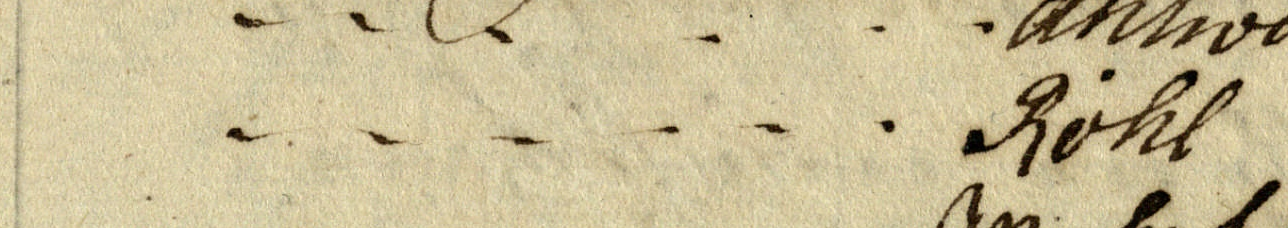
Röhl
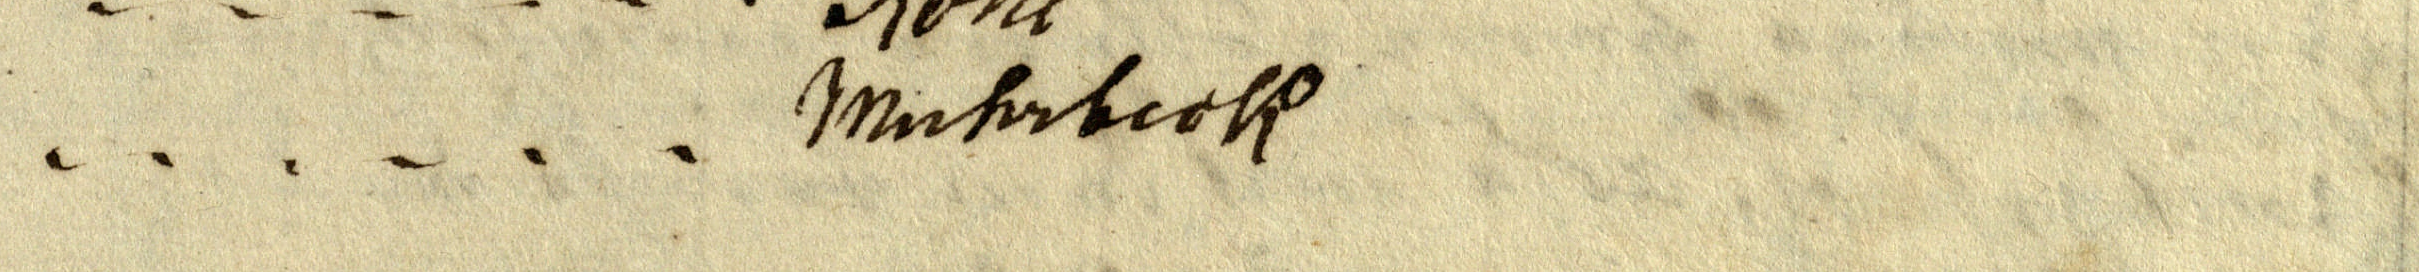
Muhrbeck
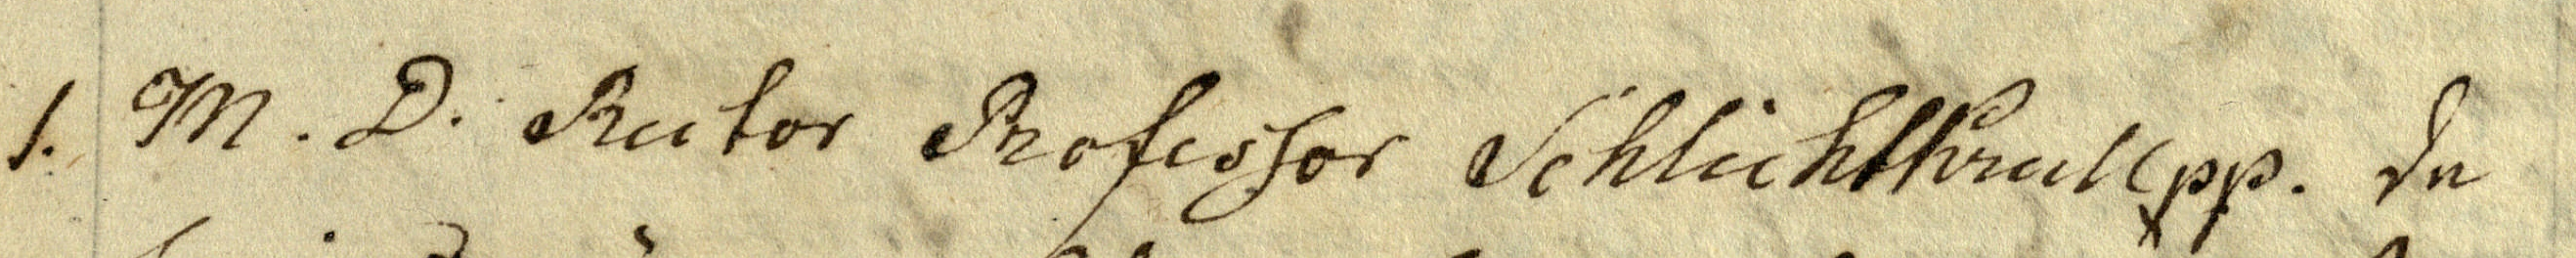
M. D. Rector Professor Schlichtkrull pp. da
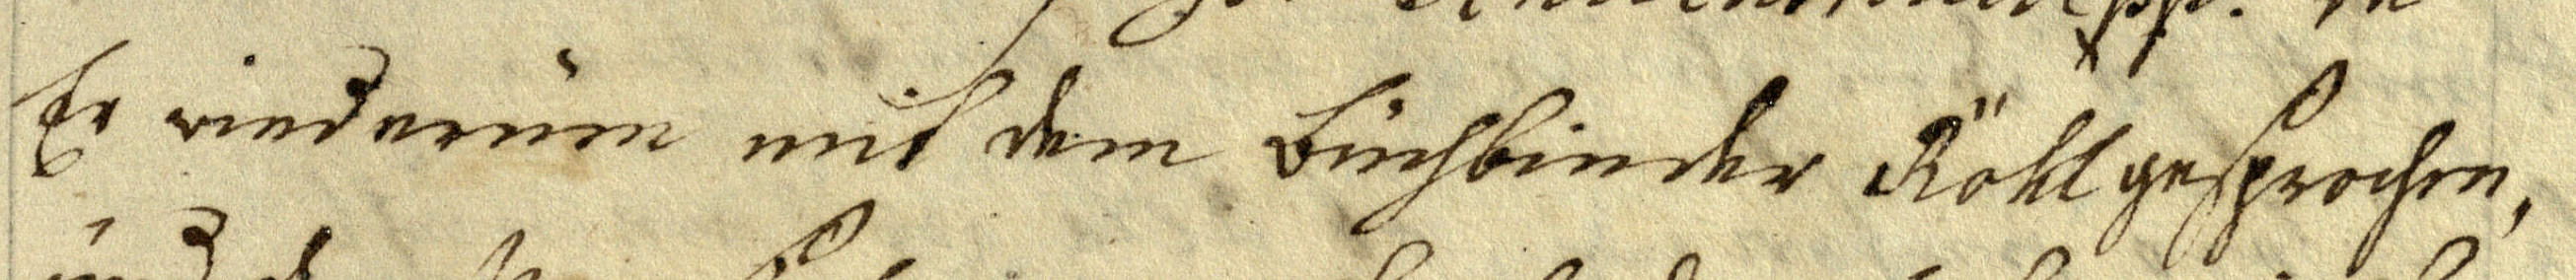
Er wiederum mit dem BuchbinderRöhl gesprochen,
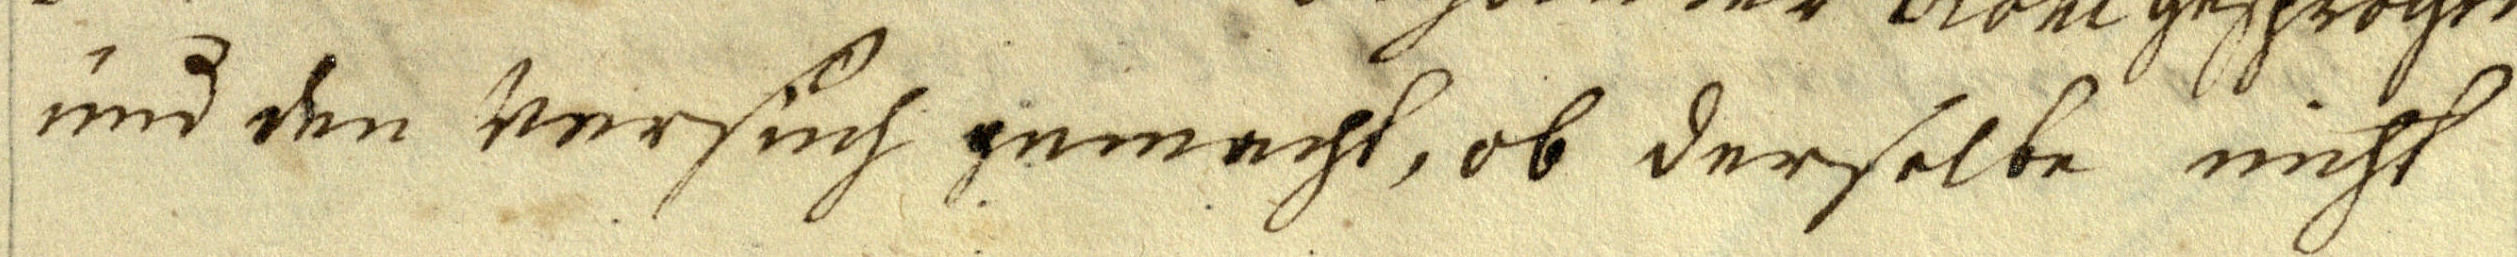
und den Versuch gemacht, ob derselbe nicht
